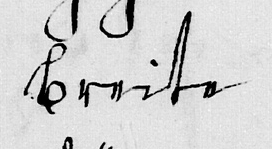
Breite
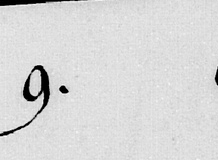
9.
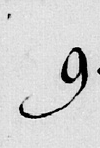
6.
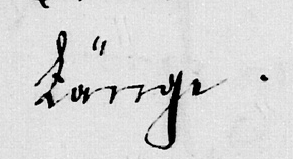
Länge
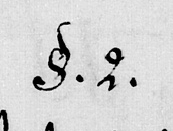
§. 2.
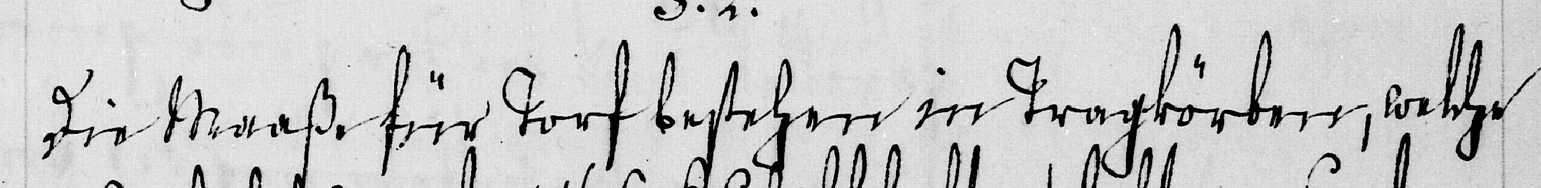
Die Maaße für Torf bestehen in Tragkörben, welche
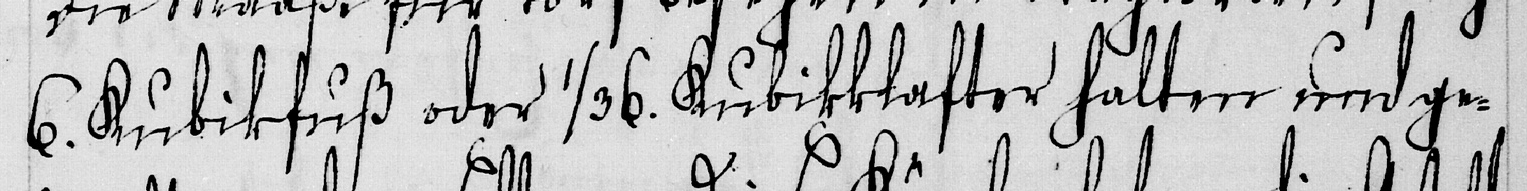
6. Kubikfuß oder 1/3 6. Kubikklafter halten und ge¬
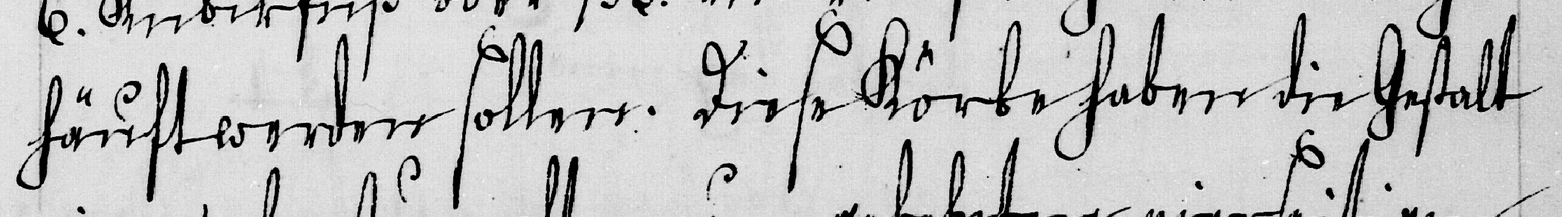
häuft werden sollen. Diese Körbe haben die Gestalt
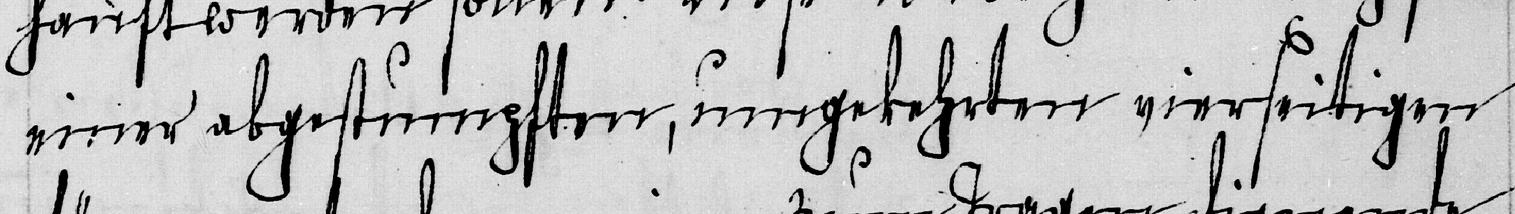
einer abgestumpften, umgekehrten vierseitigen
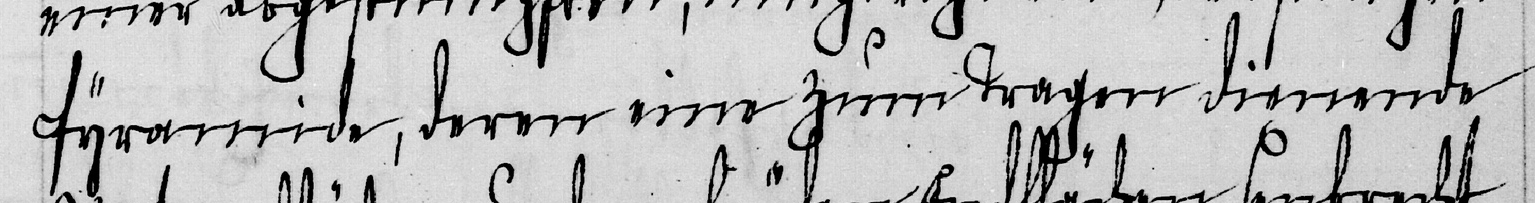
Pyramide, deren eine zum Tragen dienende
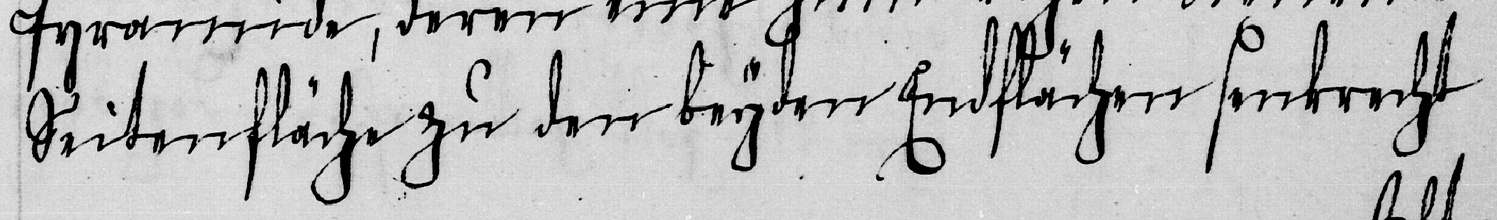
Seitenfläche zu den beyden Endflächen senkrecht
